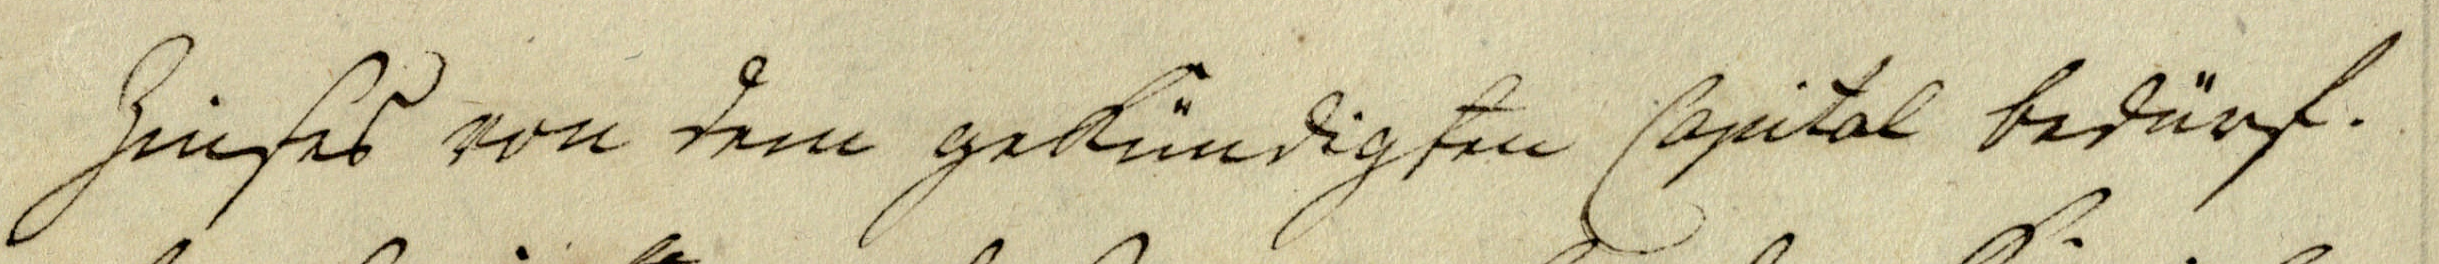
Zinses von dem gekündigten Capital bedürf¬
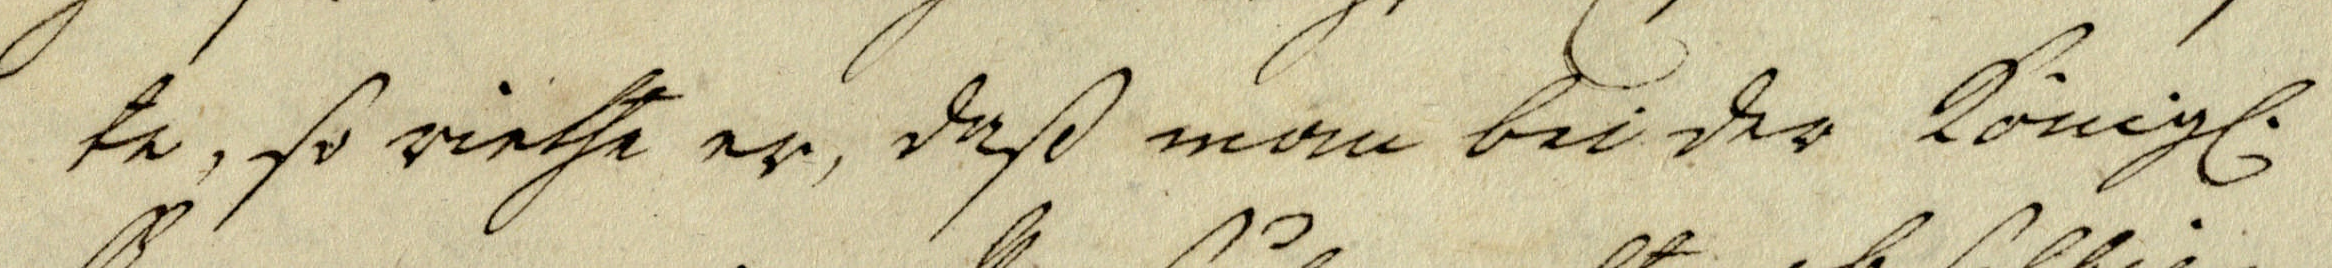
te, so riethe er, daß man bei der Königl.
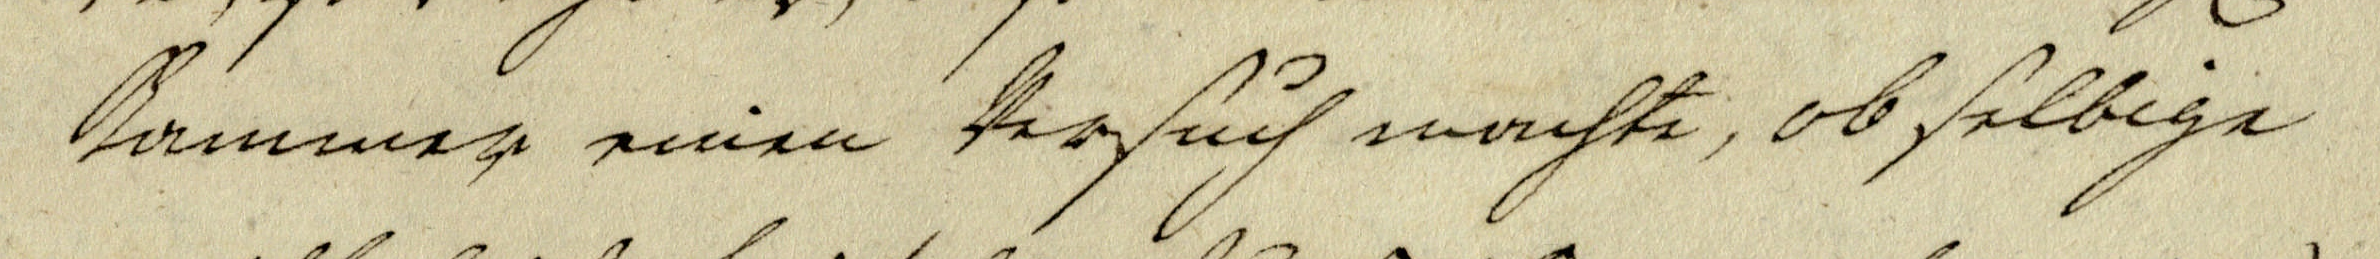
Kammer einen Versuch machte, ob selbige
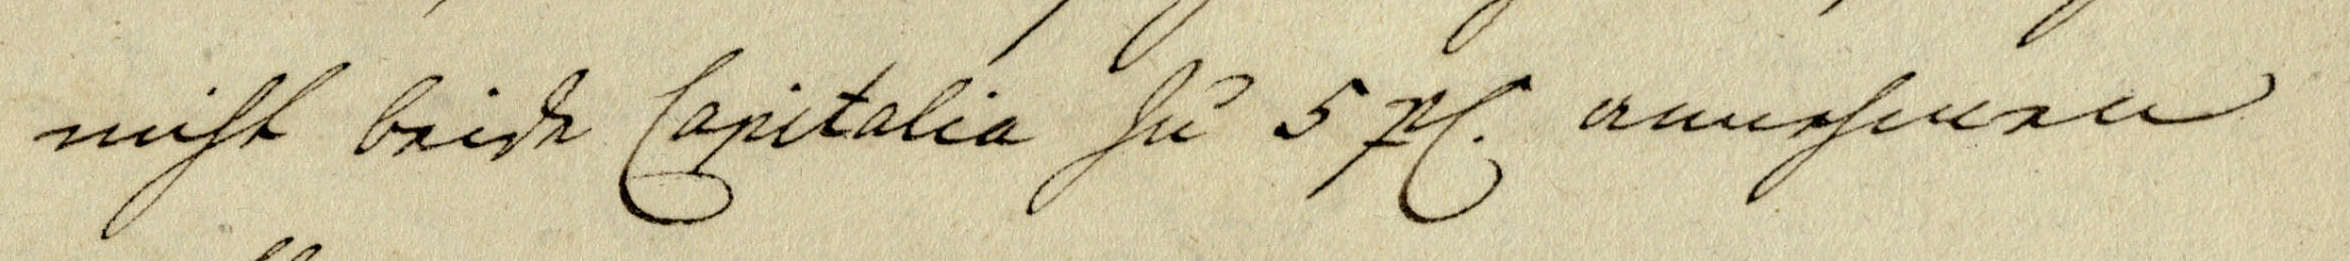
nicht beide Capitalia zu 5 pl. annehmen
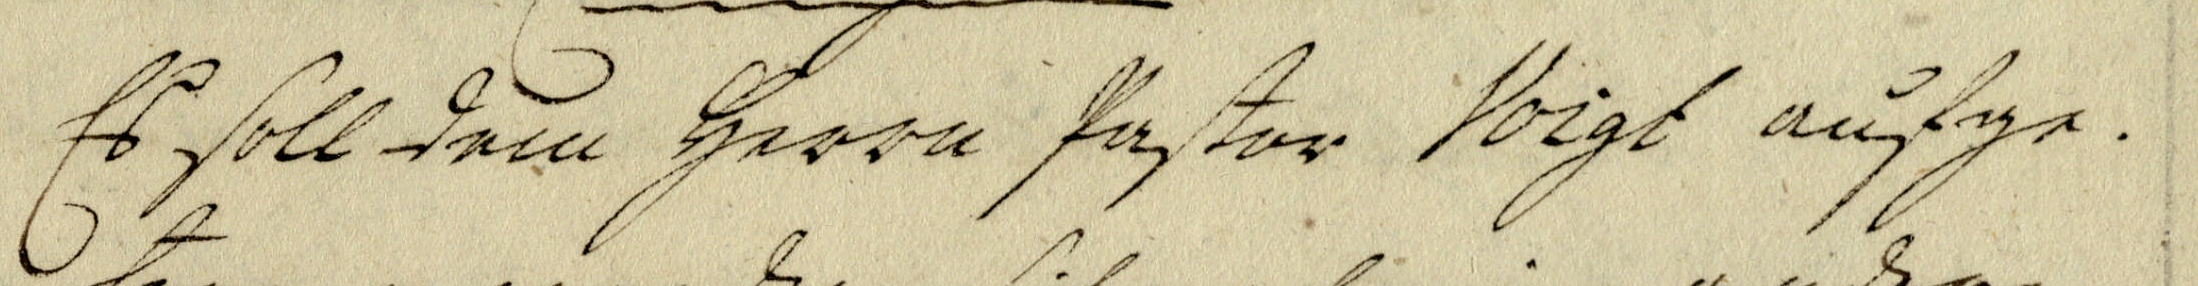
Es soll dem Herrn Pastor Voigt aufge¬
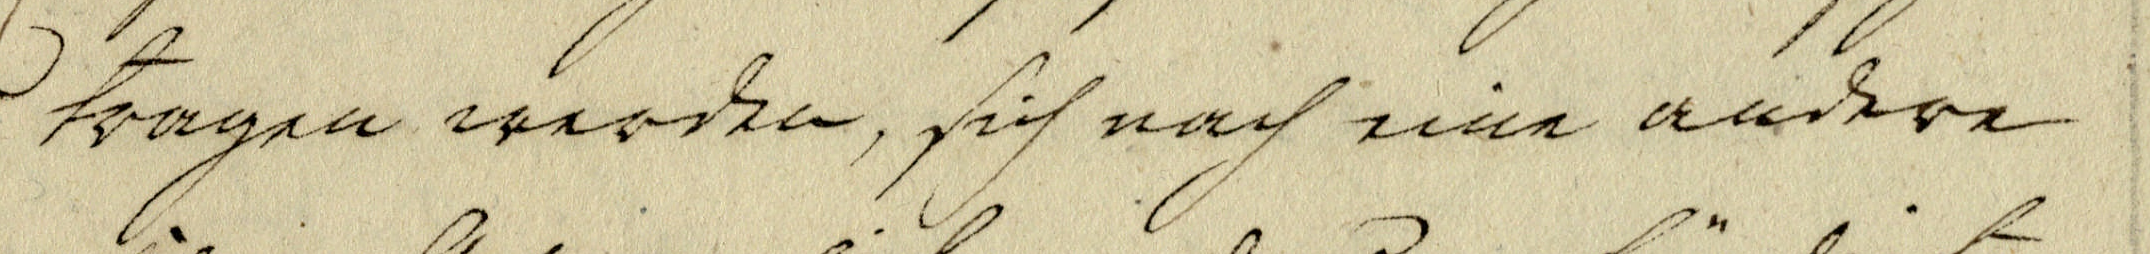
tragen werden, sich nach eine andere
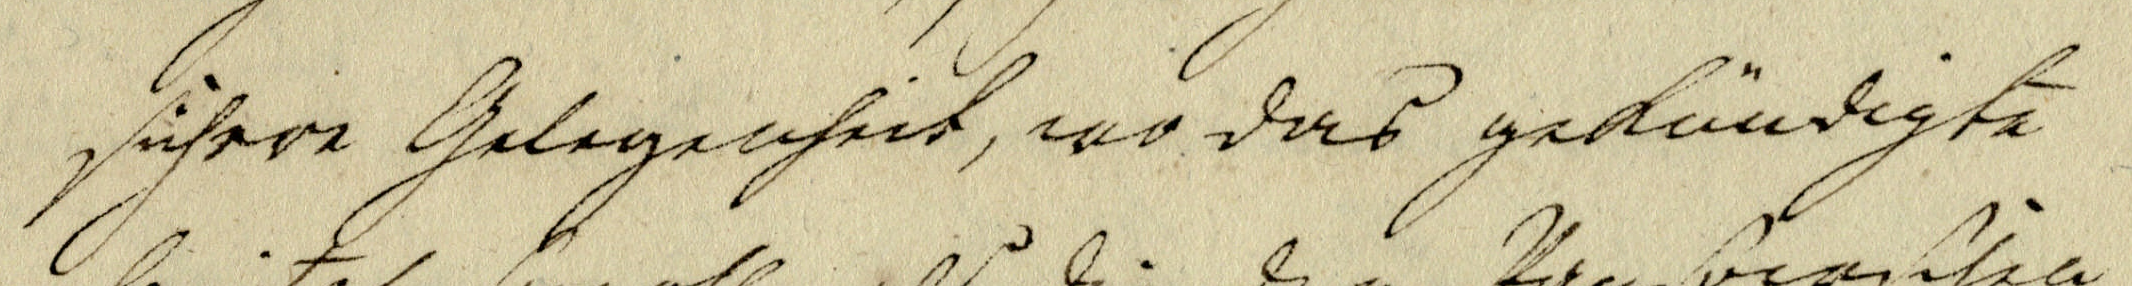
sichere Gelegenheit, wo das gekündigte
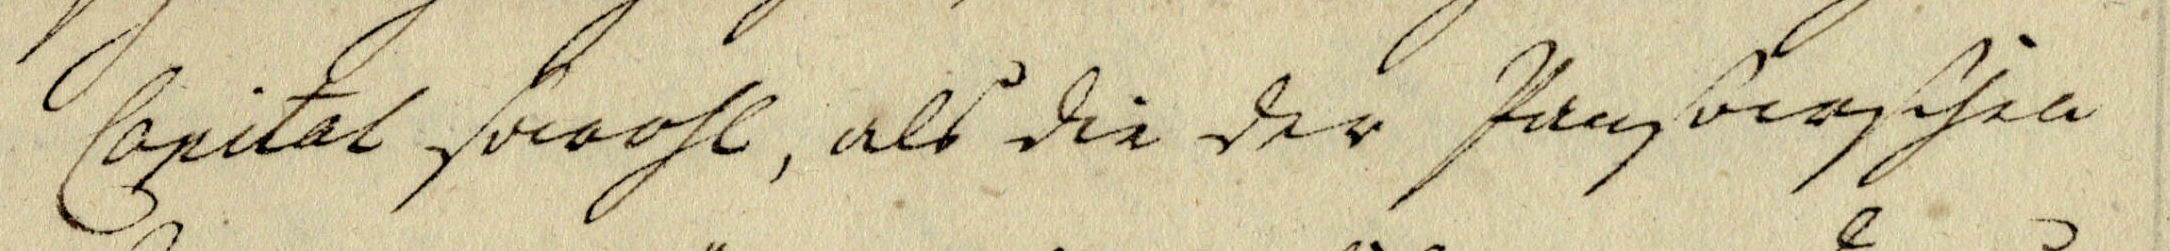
Capital sowohl, als die der Pansowschen
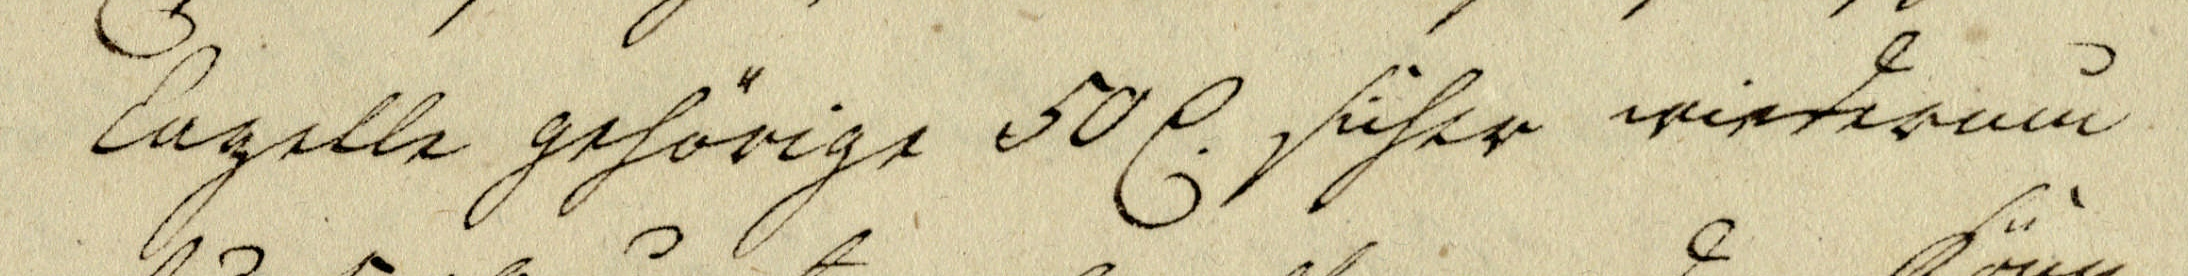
Capelle gehörige 50 l. sicher wiederum
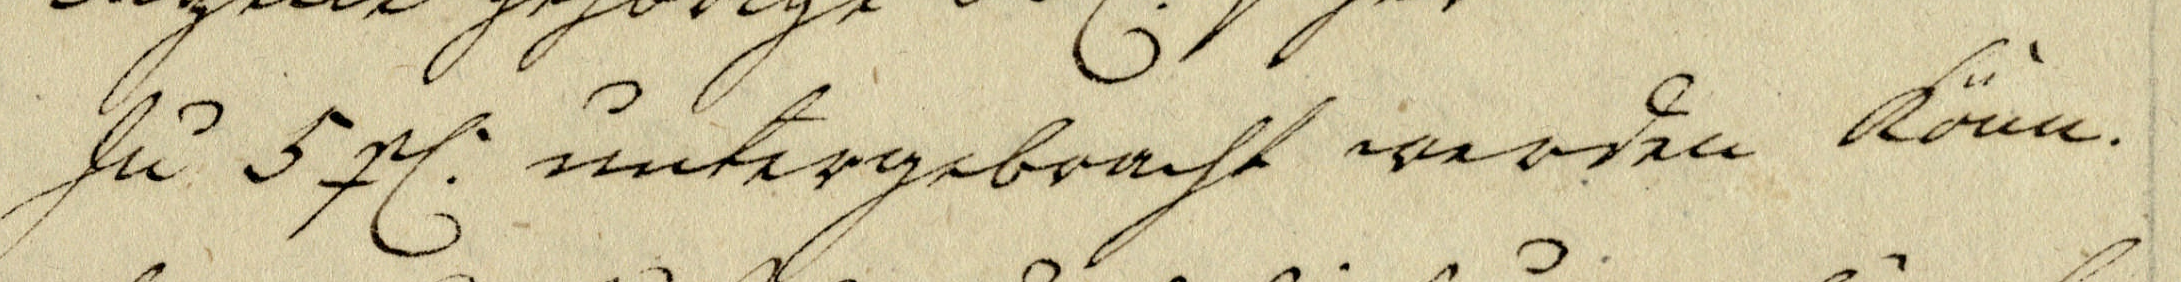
zu 5 pl. untergebracht werden könn¬
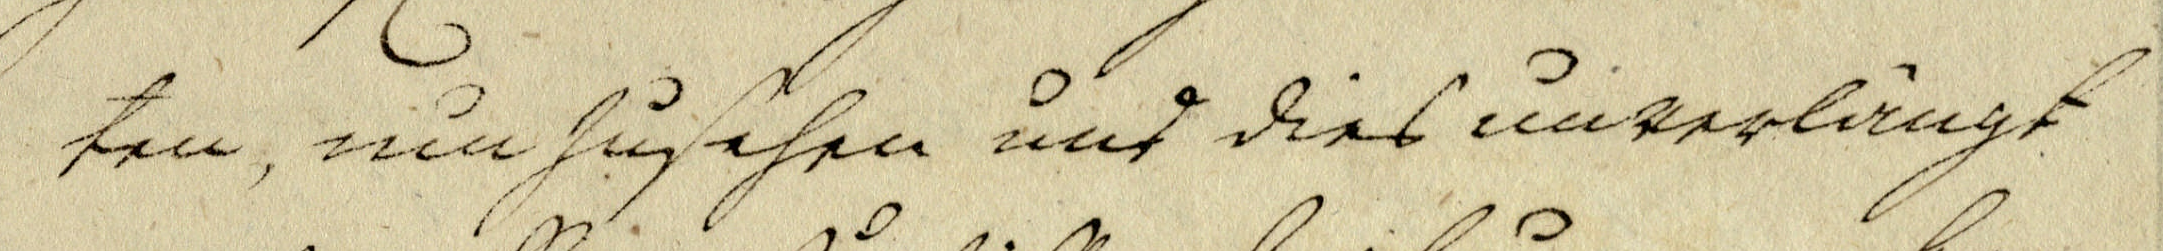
ten, um zusehen und dies unverlängt
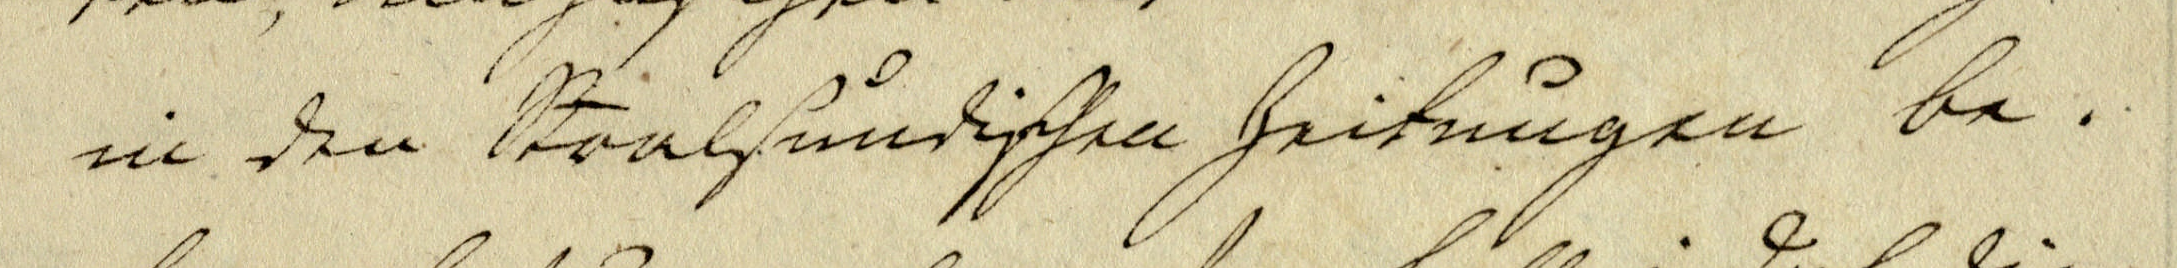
in den Stralsundischen Zeitungen be¬
